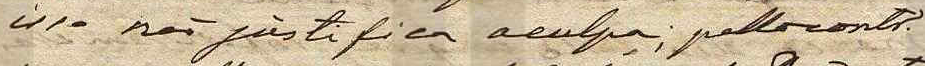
isso naõ justifica a culpa; pello contr.o
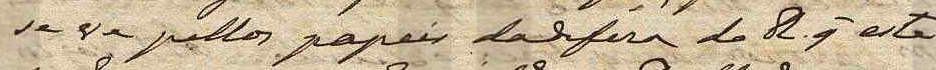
se ve pellos papeis da defeza do R. q̄ este
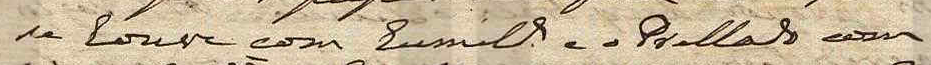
se houve com humil.e e o Prellado com
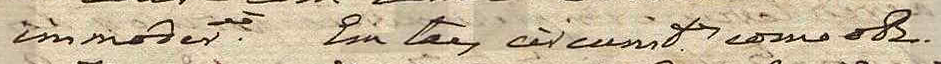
immoder.aõ Em taes circunst.as como o R.
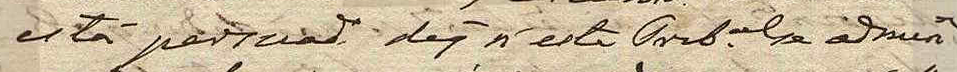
está persuad.o de q̄ neste Trib.al se admen.a
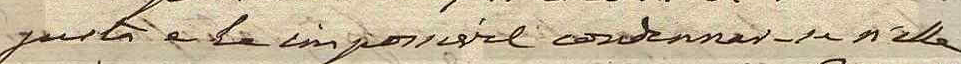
justa e he impossivel condennar-se n'elle
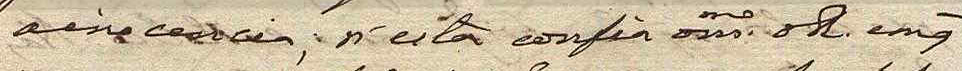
a inocencia, n'esta confia o m.mo o R. em q̄
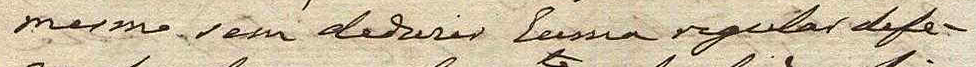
mesmo sem deduzir huma regular defe
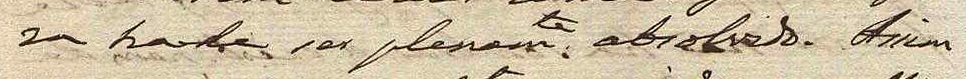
za ha de ser plenam.te absolvido. Assim
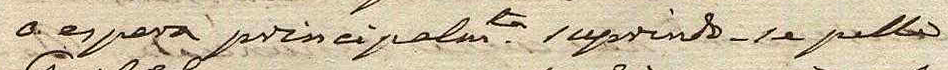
o espera principalm.te suprindo-se pello
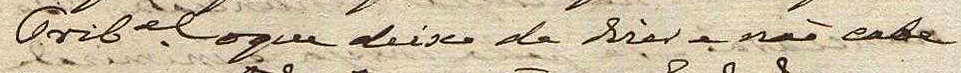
Trib.al o que deixo da dizer e naõ cabe
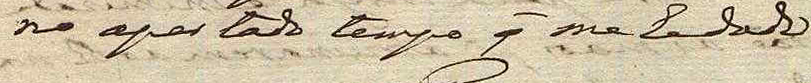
no apertado tempo q̄ me he dado
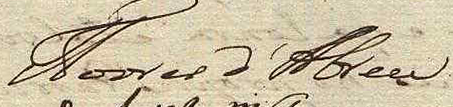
Alvores d'Abreu
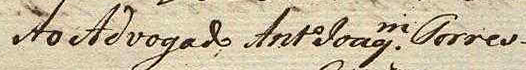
Ao Advogado Ant.o Ioaq.m Torres
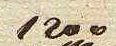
1200
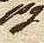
pg
